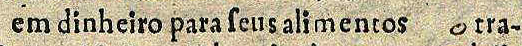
em dinheiro para seus alimentos o tra
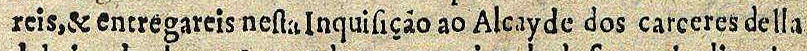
reis, & entregareis nesta Inquisição ao Alcayde dos carceres della
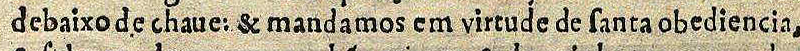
debaixo de chaue: & mandamos em virtude de santa obediencia,
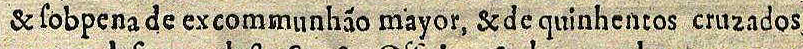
& sob pena de excommunhão mayor, & de quinhentos cruzados
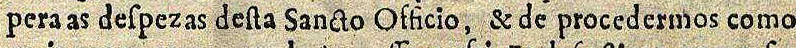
pera as despezas desta Sancto Officio, & de procedermos como
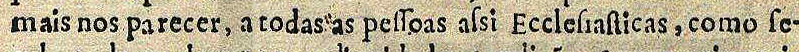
mais nos parecer, a todas as pessoas assi Ecclesiasticas, como se
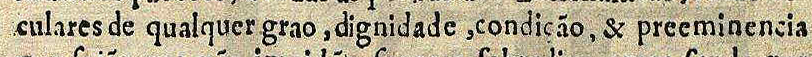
culares de qualquer grao, dignidade, condição, & preeminencia
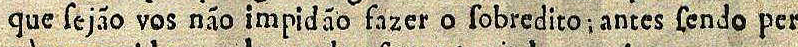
que sejão vos não impidão fazer o sobredito: antes sendo per
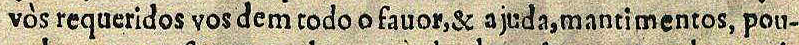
vòs requeridos vos dem todo o fauor, & ajuda, mantimentos, pou
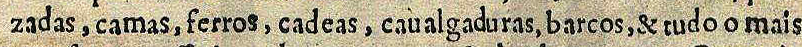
zadas, camas, ferros, cadeas, caualgaduras, barcos, & tudo o mais
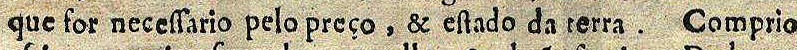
que for necessario pelo preço, & estado da terra. Comprio
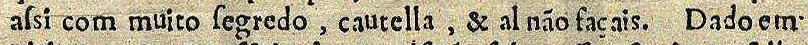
assi com muito segredo, cautella, & al não façais. Dado em
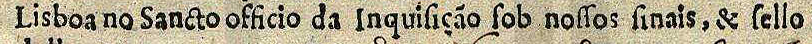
Lisboa no Sancto officio da Inquisição sob nossos sinais, & sello
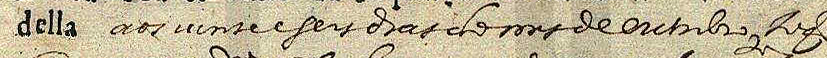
della aos uinte e seis dias do mes de outubro Ioā
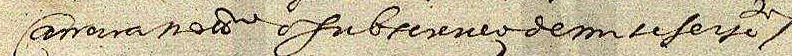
Carreira nottro o subscreueo de mil e seisctos
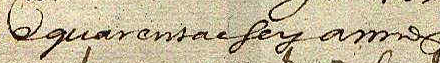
e quarenta e seis annos
